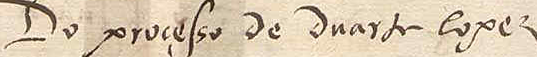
Do processo de duarte lopez
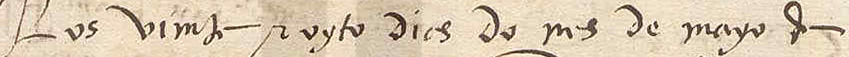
Aos vimte e oyto dias do mes de mayo de
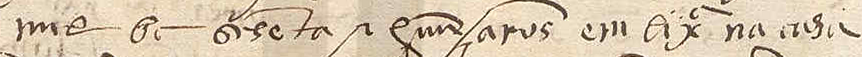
mil bc sesēta e hūu an̄os em lixa na casa
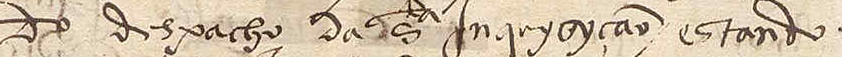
Do despacho da Sta Jnquysyção / estando.
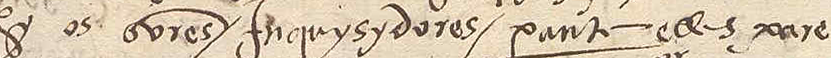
hy os sōres / Jnquysydores / ꝑante elles pare
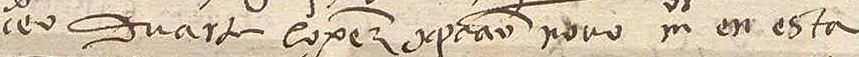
ceo Duarte lop̄ez xpaão nouo mor em esta
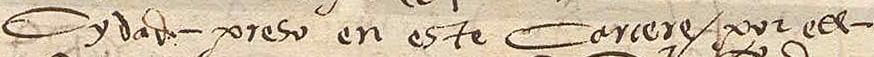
Cydade preso en este Carcere / por elle
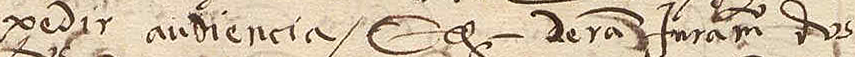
pedir audiencia / E lhe derā Juramto dos
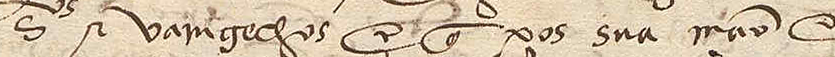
Stos evamgelhos ē q̄ pos sua mão e
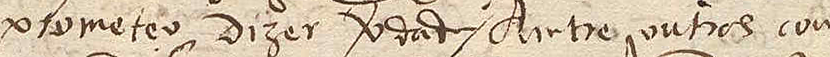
prometeo dizer ꝟdade / Amtre outras cou
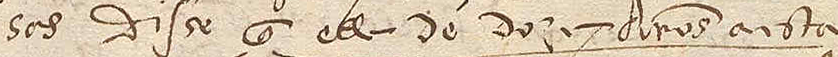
sas Disse q̄ elle de doze An̄os a esta
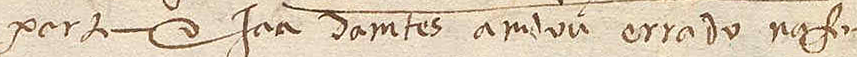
parte e Jaa damtes amdou errado na fe
